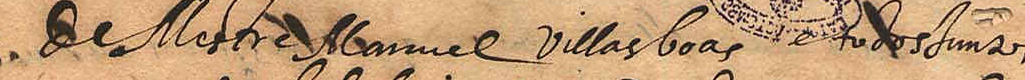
de Mestre Manuel villas boas e todos Juntos
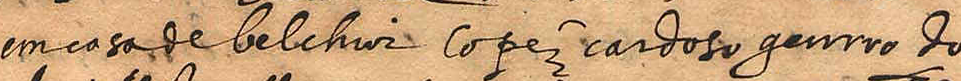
em casa de belchior lopez̄ cardoso genrro do
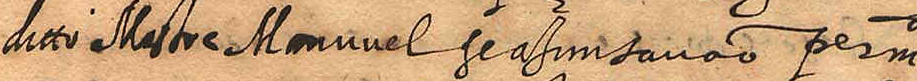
ditto Mestre Manuuel se aJuntauaõ per mtas
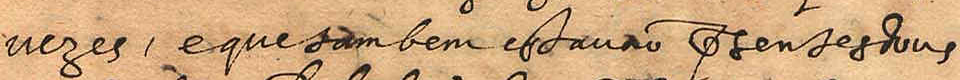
vezes / e que também estavaõ p̄sentes dous
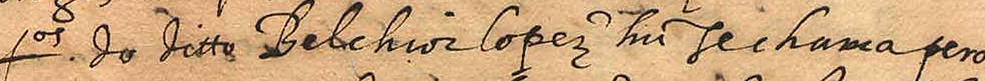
fos do ditto Belchior lopez̄ hū se chama pero
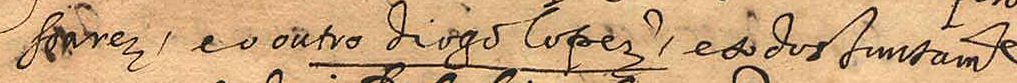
soarez / e o outro diogo lopez̄/ e todos juntamte
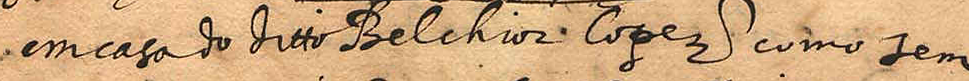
em casa do ditto Belchior lopez̄ como tem
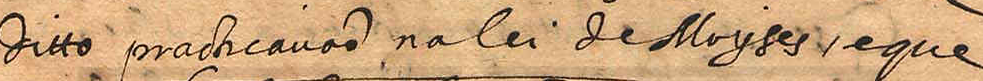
ditto practicauaõ na lei de Moyses/ e que
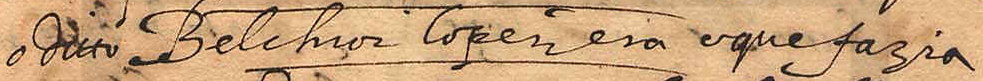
o ditto Belchior lopez̄ era o que fazia
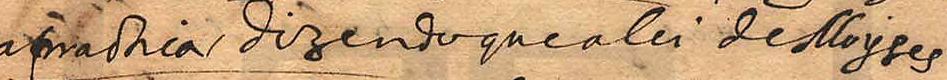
a practica, dizendo que a lei de Moyses
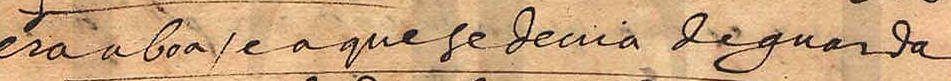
era a boa / e a que se devia de guardar,
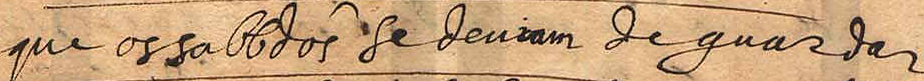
e que os sabbdos̄ se deuiam de guardar
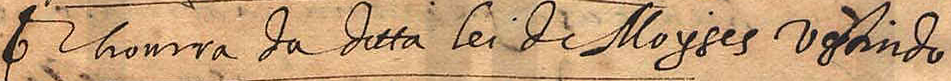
p̄r honrra da ditta lei de Moyses vestindo
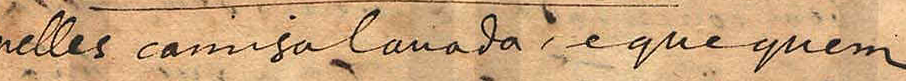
nelles camisa lauada, e que quem
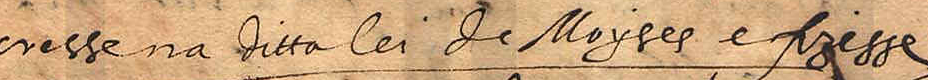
cresse na ditta lei de Moyses e fizesse
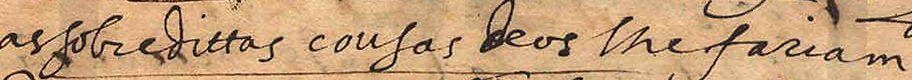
as sobredittas cousas deos lhe faria mta
